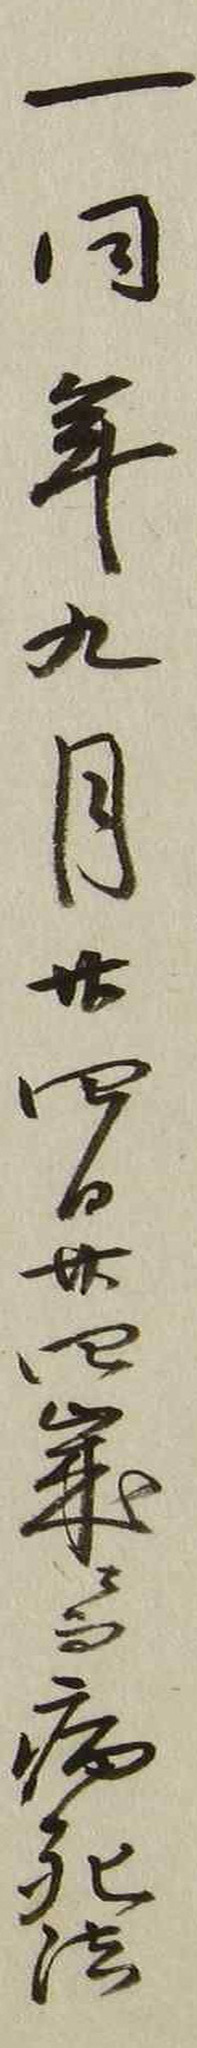一同年九月廿四日廿四歳ニ而病死法
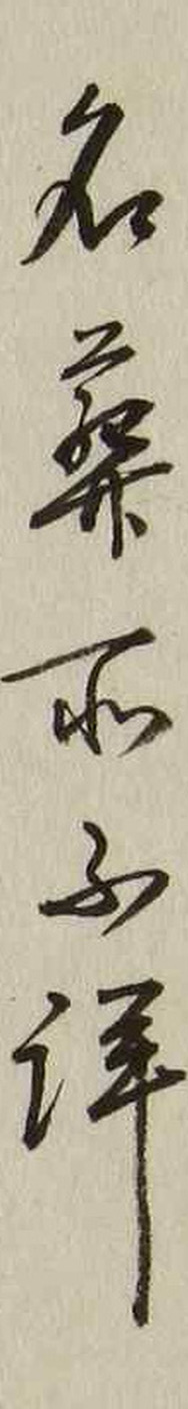名葬所不詳
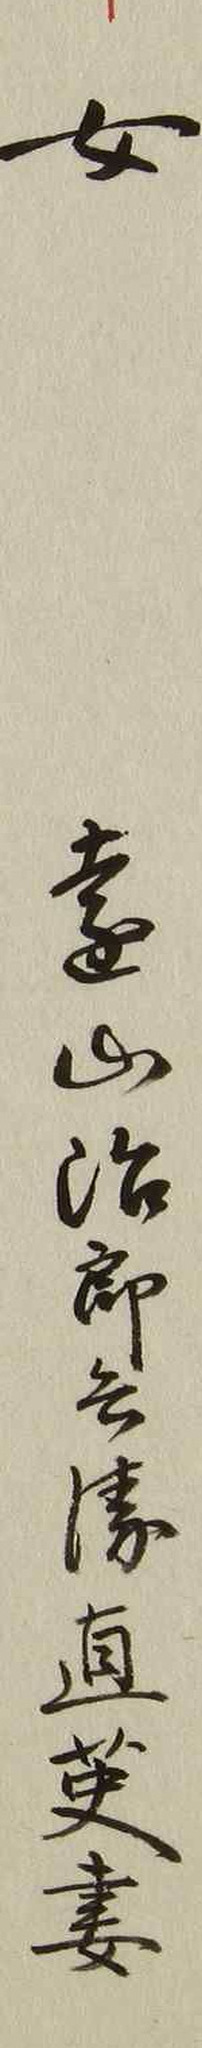女遠山治郎兵衛直英妻
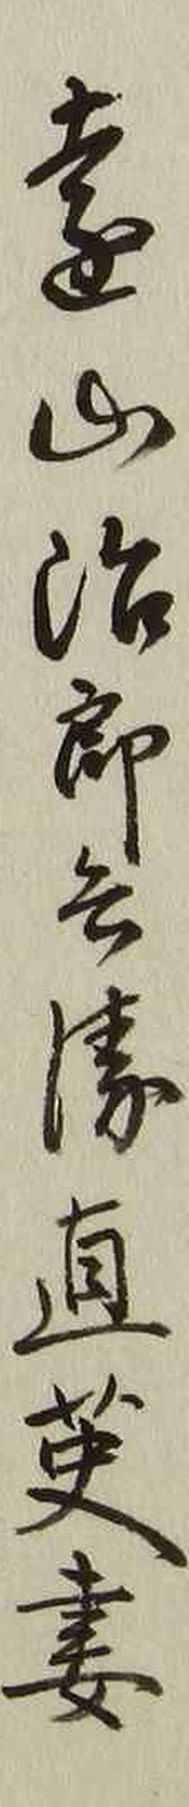女遠山治郎兵衛直英妻
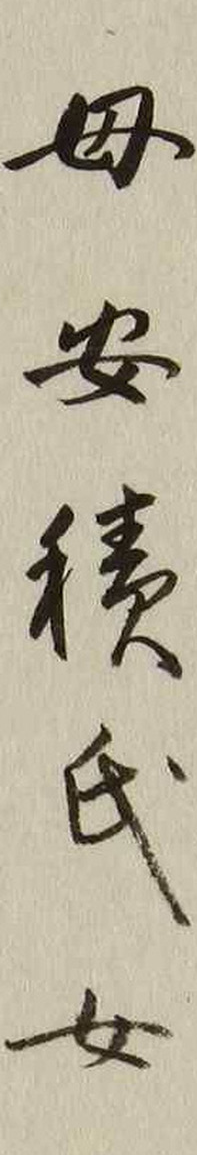母安積氏女
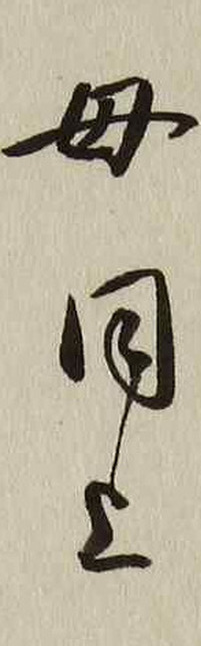母同上
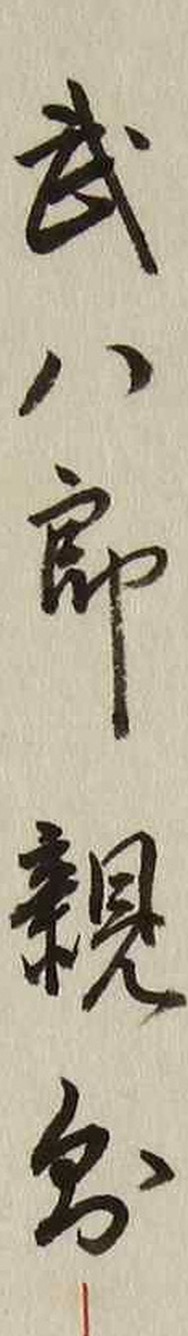武八郎親則
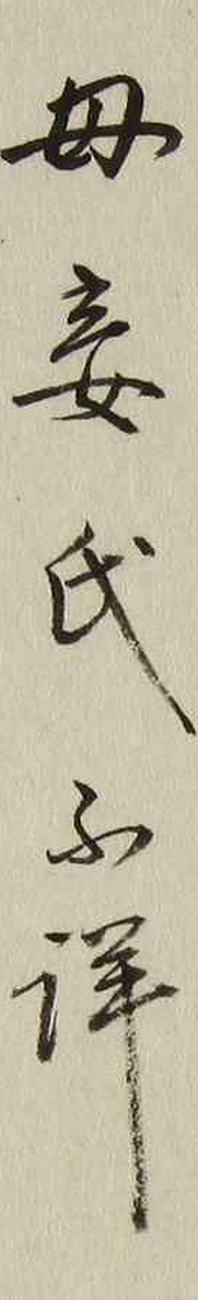母妾氏不詳
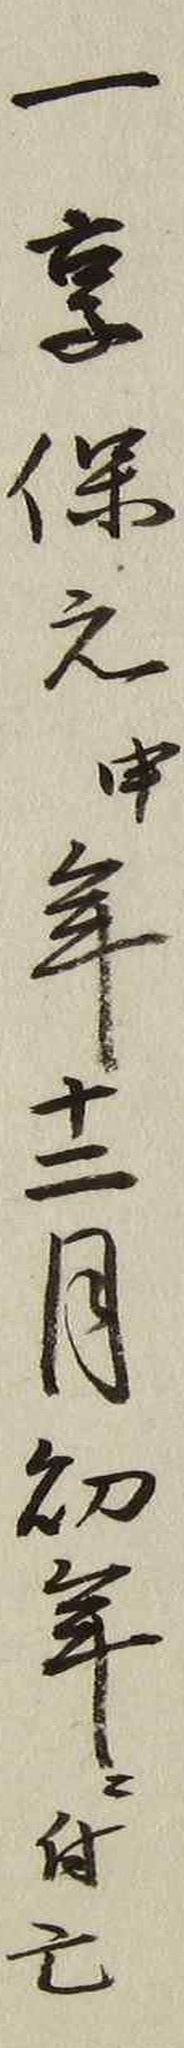一享保元申年十二月幼年ニ付亡
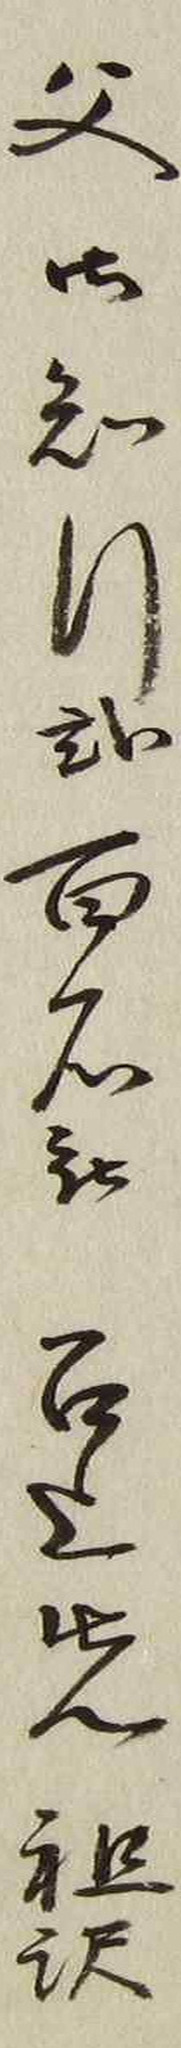父御知行弐百石被召上先祖訳
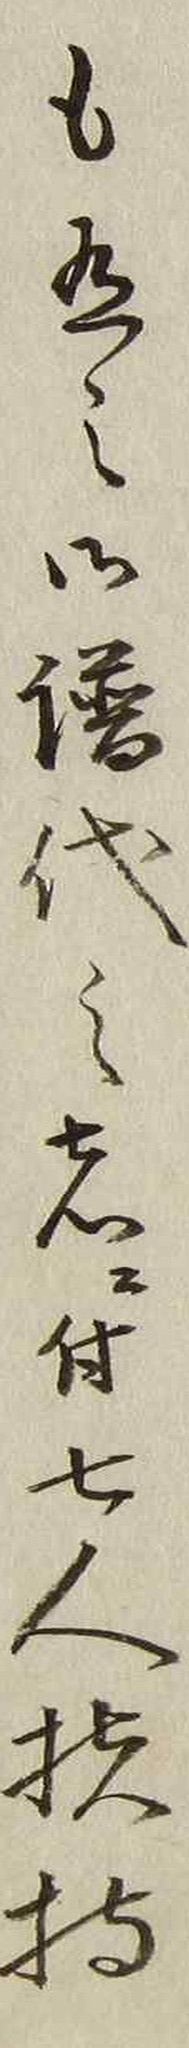も有之御譜代之者ニ付七人扶持
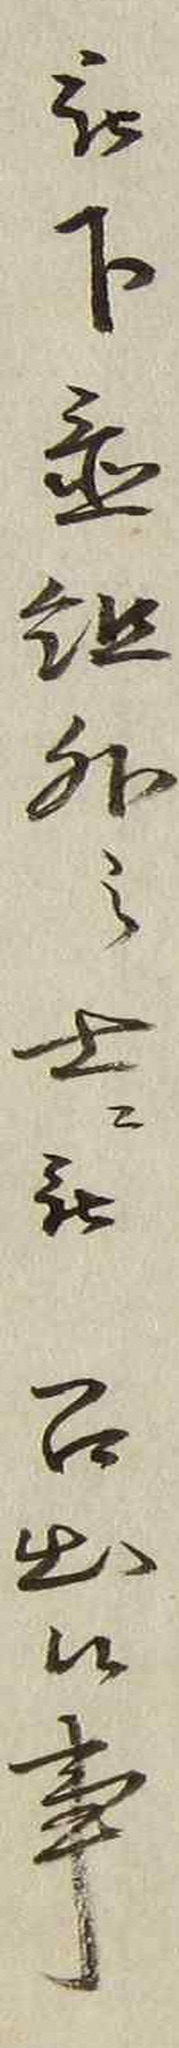被下置組外之士ニ被召出候事

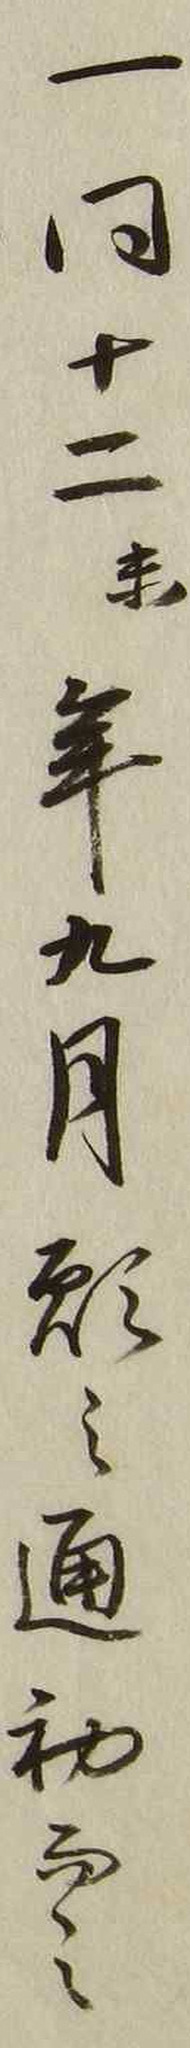一同十二未年九月願之通初而之
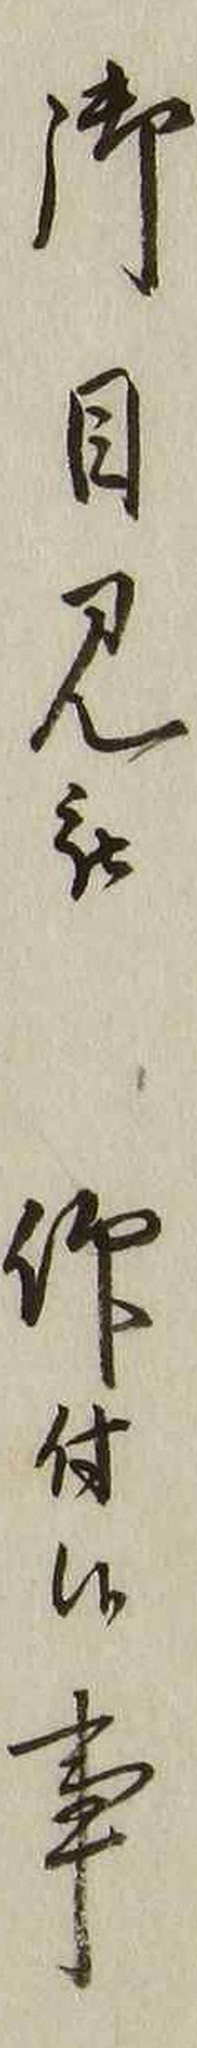御目見被仰付候事
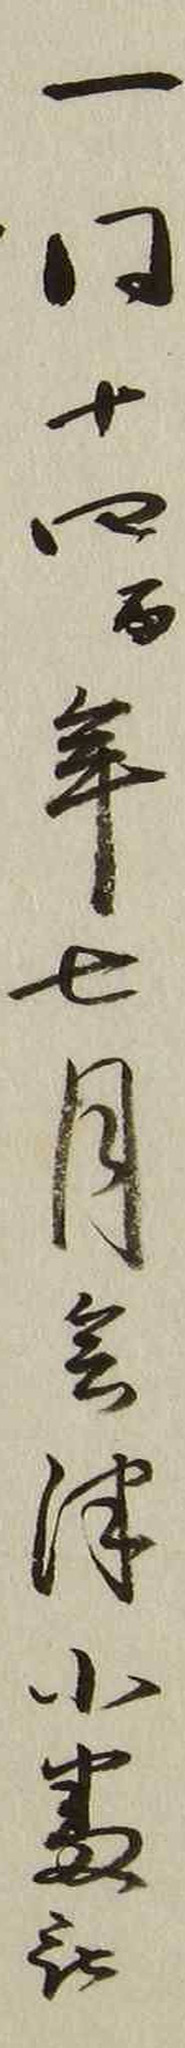一同十四酉年七月会津小番被
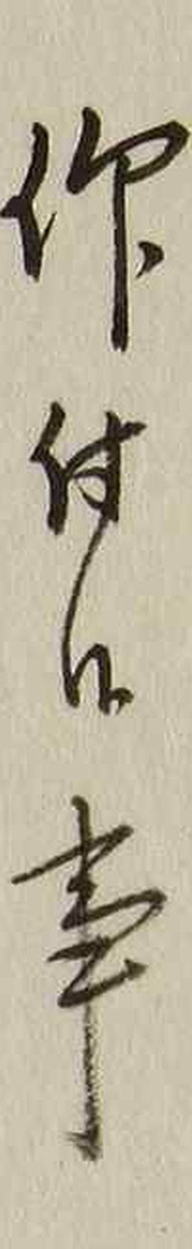仰付候事
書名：諸士系譜　巻之149　そ之部2
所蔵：会津若松市立会津図書館
